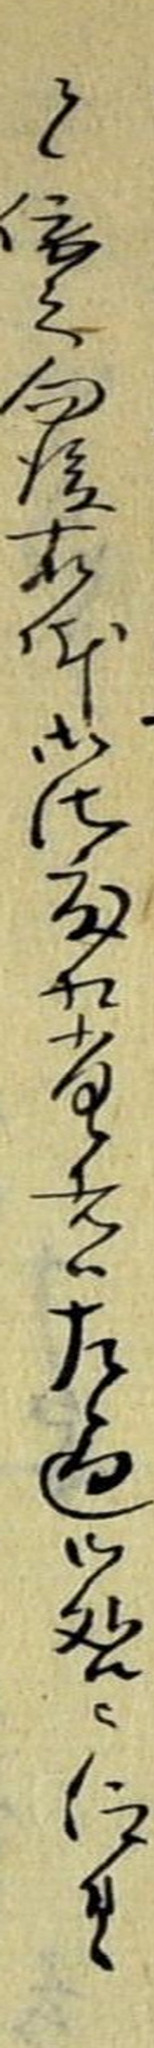に候依之向後右体御法度相背候者は左之通御咎被仰付候
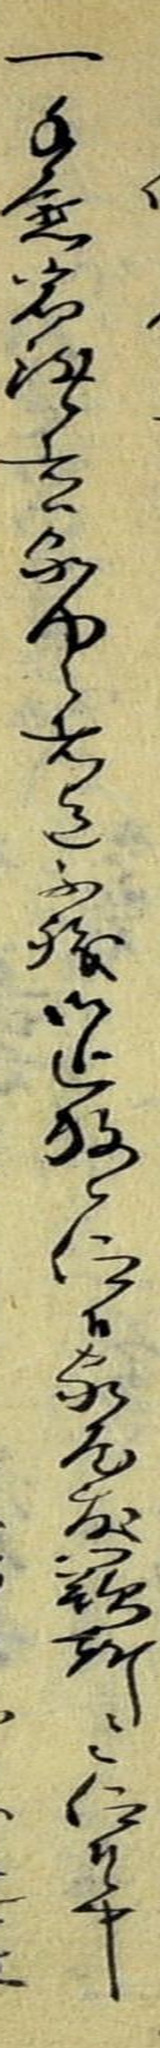一手慰宿致候者は家内之者迄不残御追放被仰付家屋敷闕所に被仰付候事
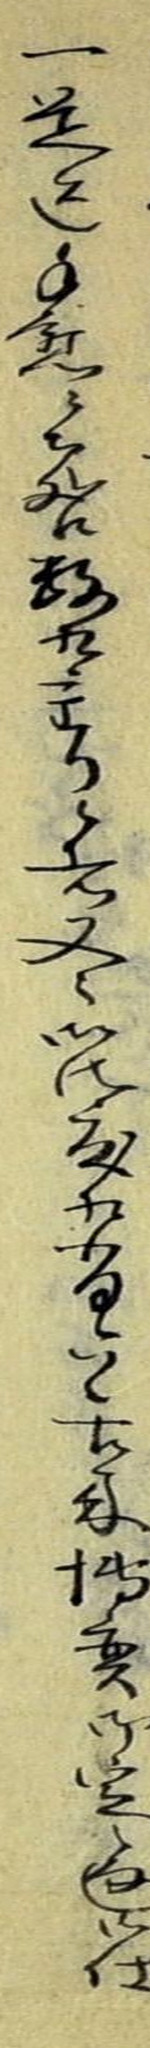一是迄手慰に而咎数相重り候者又々御法度相背候はヽ古来博奕御定之通御仕
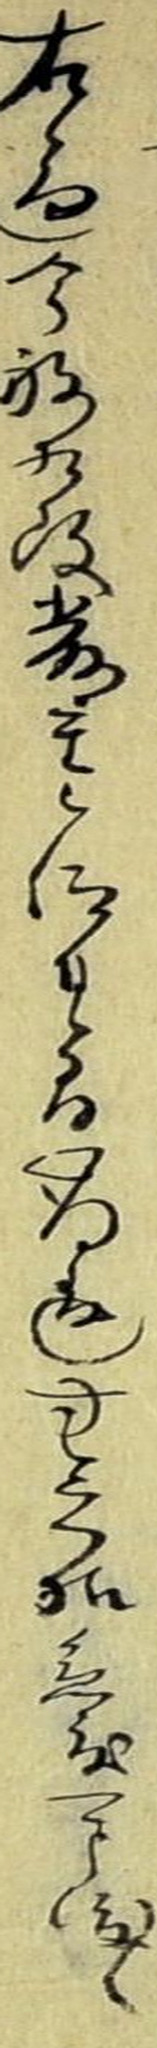右之通今般相改厳重被仰付候間心得違無之様急度可申渡候
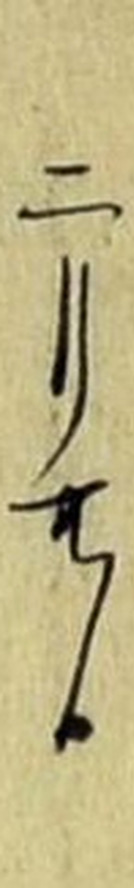二月廿日
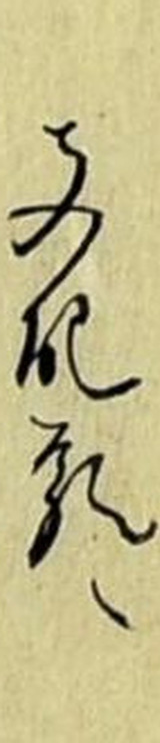支配頭へ
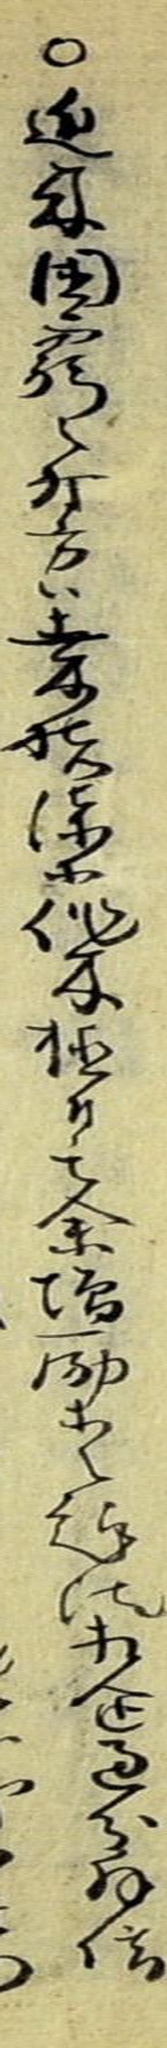○近来困窮之村方は桑指漆等作米植付其余増励等之趣法相企過分拝借
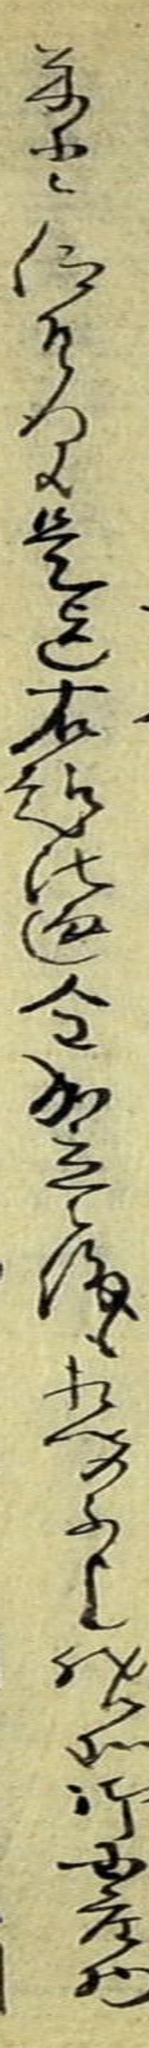米等被仰付候得共是迄右趣法通全成立候儀も相聞不申候然処御国産物
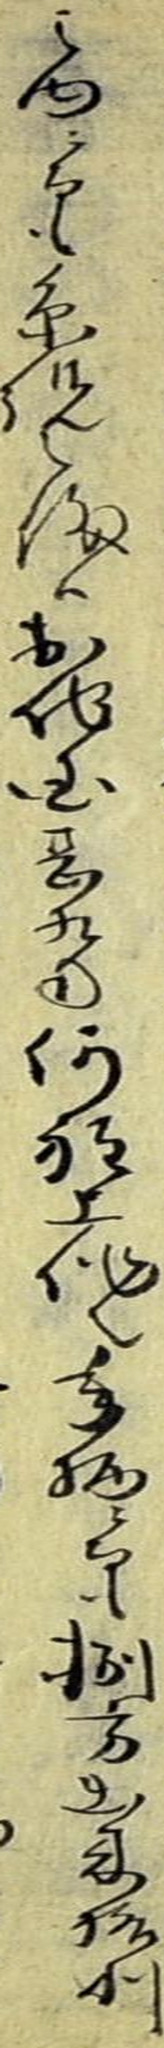之内に而も糸繭之儀は於他国甚相用何程上作之年柄に而も捌方出来格別
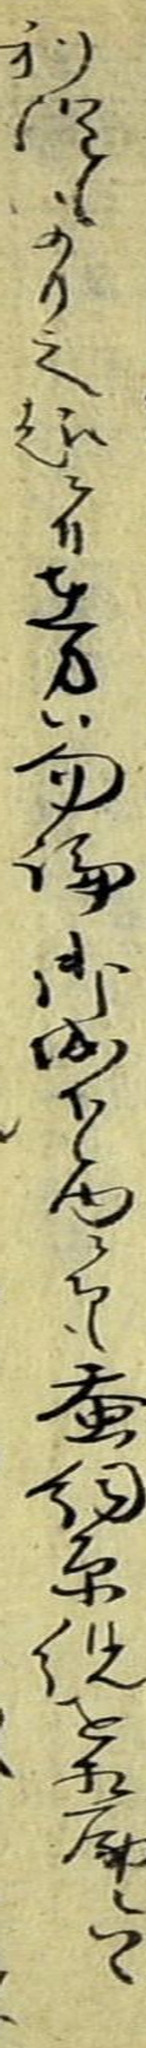利潤も有之趣に付在方は勿論御城下之内に而も蚕飼糸繭を相励候はヽ
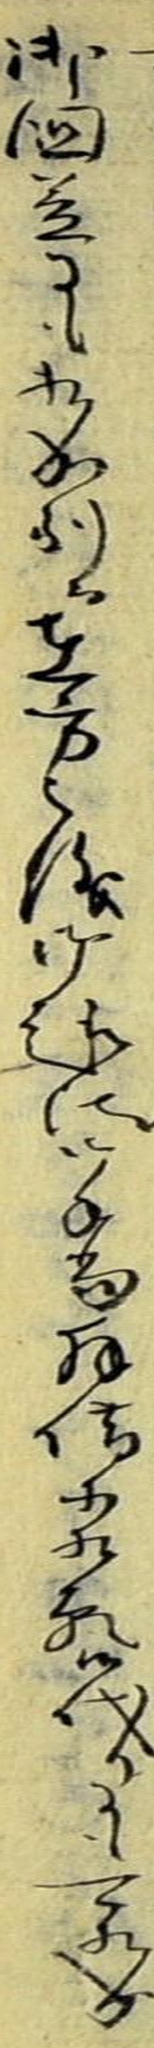御国益にも相成別而在方之儀御趣法御手当拝借等相願候代りにも可相成

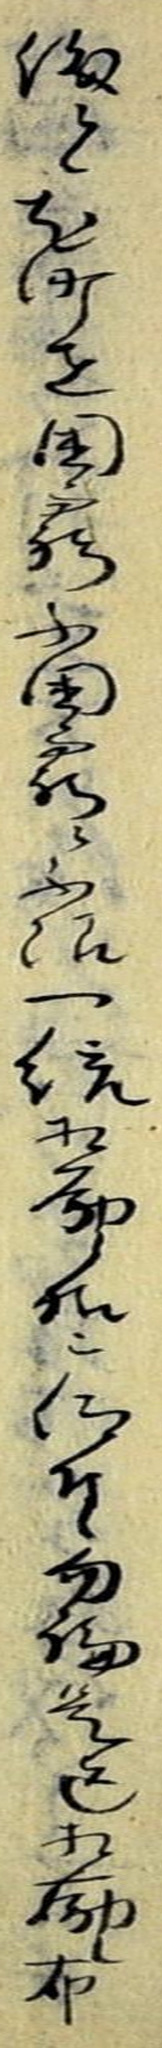儀に候尤町在困窮不困窮に不限一統相励候様被仰付勿論是迄相励候布
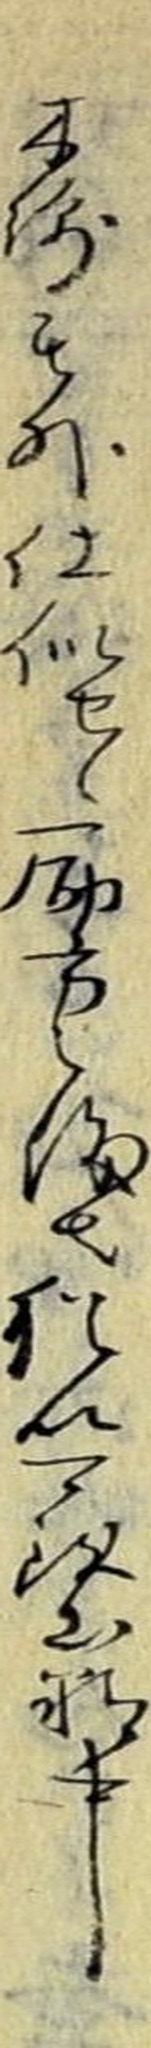木綿其外仕似セ之励方之儀は猶以可致出精事
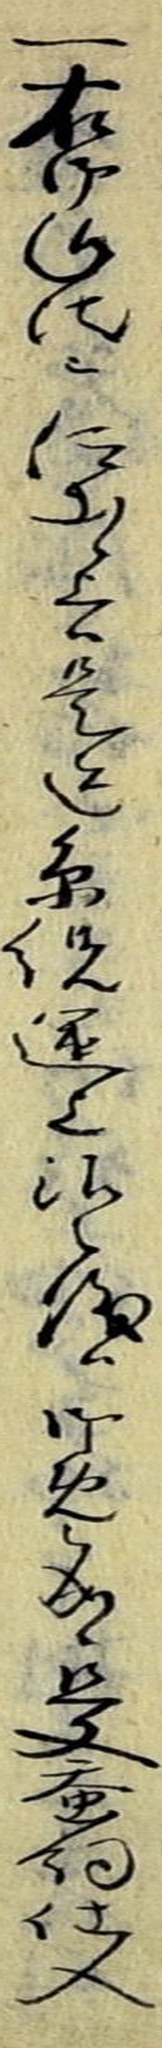一右御趣法被仰出候上は是迄糸繭運上銀之儀は御免被成候且又蚕飼仕入
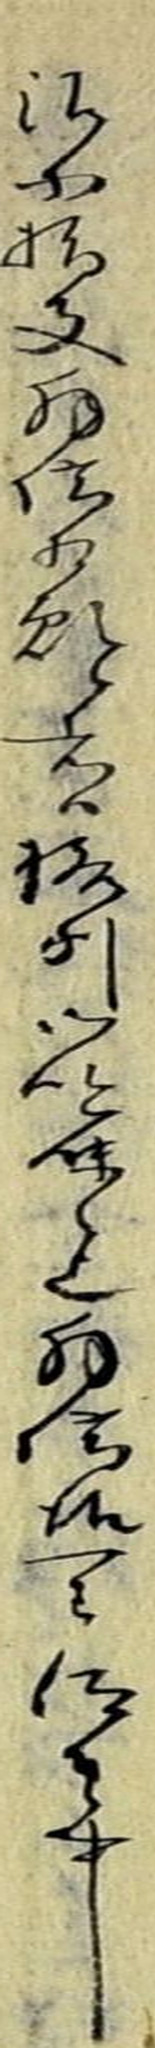銀等指支拝借相願候者は格別御吟味之上拝借候様可被仰付事
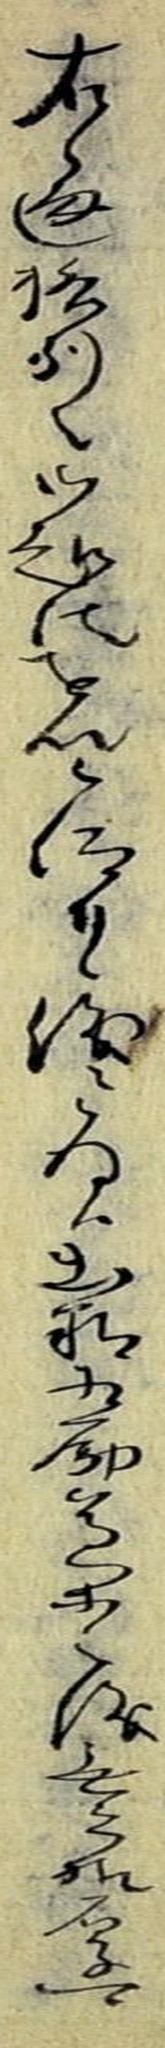右之通格別之御趣法を以被仰付候儀に候得は出精相励等閑之儀無之様厚可
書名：命令之部 四
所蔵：福井県文書館 Fukui Prefectural Archives
